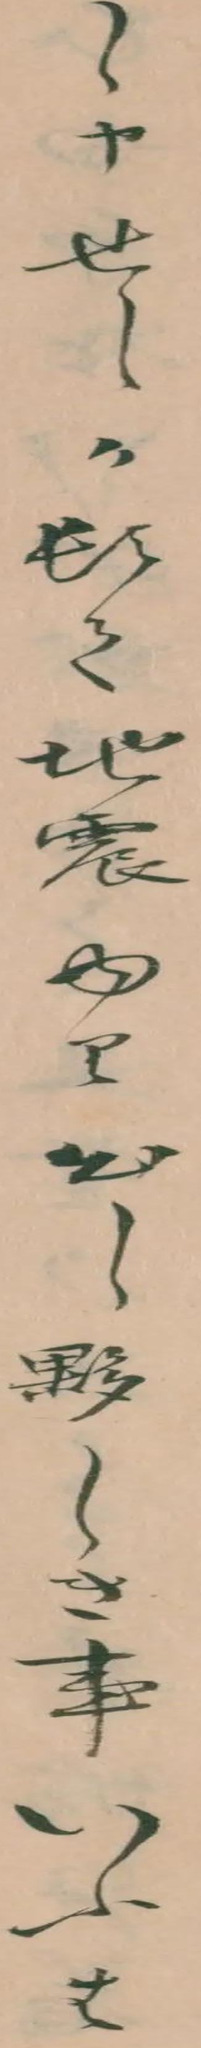し申せしか頓て地震ゆり出し夥しき事いふは
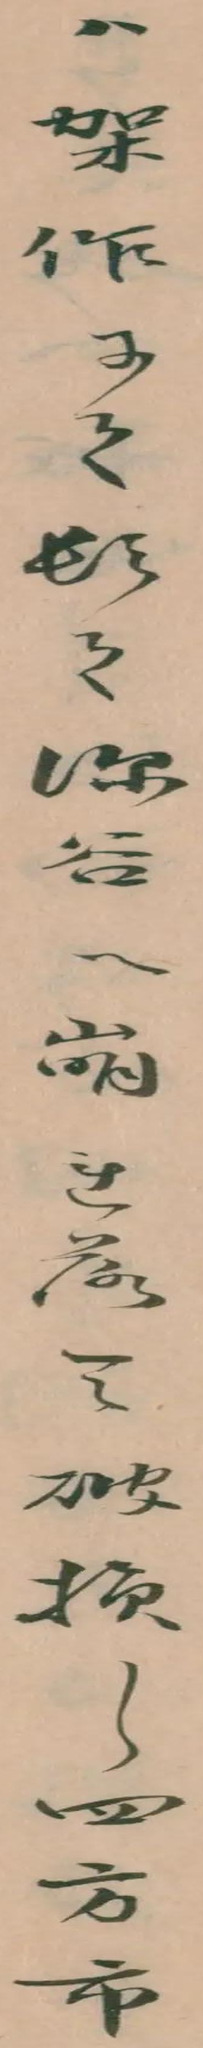は架作にて頓て深谷へ崩れ落て破損し四方市
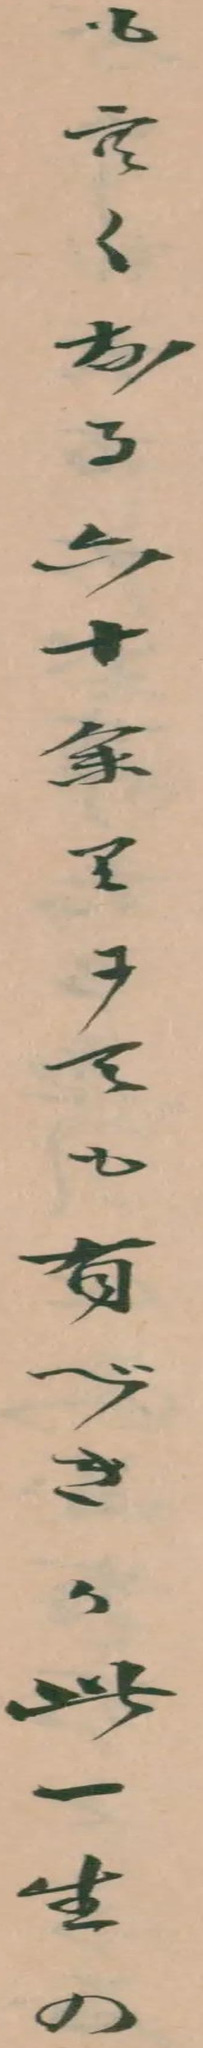も空くなる六十余りにても有べきか此一生の
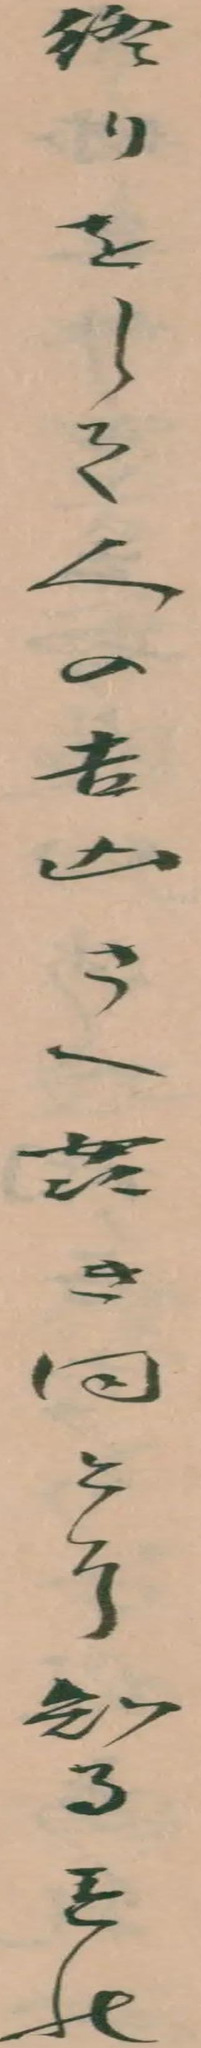終りをして人の吉凶さへ姦き同とに知るもの
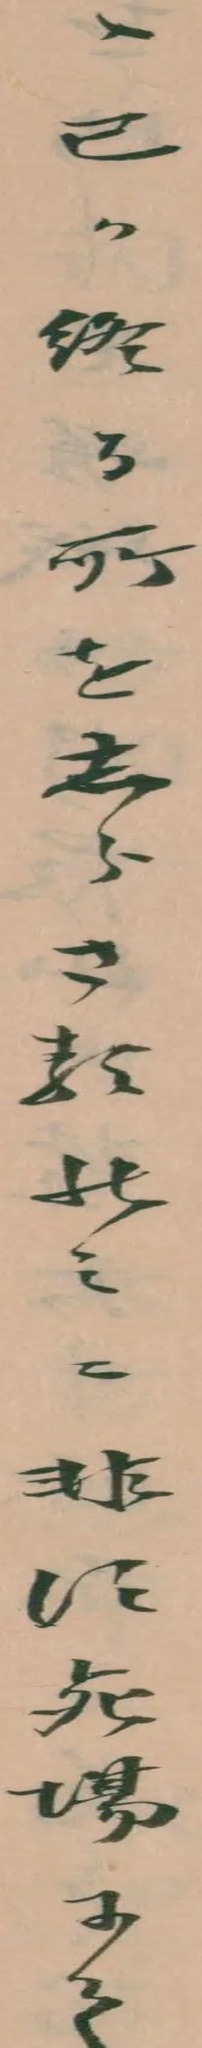ゝ己か終る所をしらさるのみに非す死傷にて
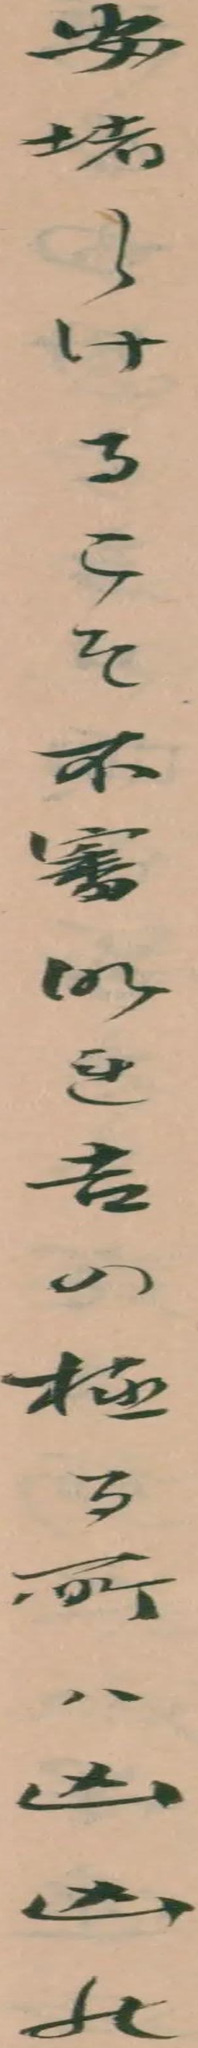安堵しけるこそ不審なれ吉の極る所は凶凶の
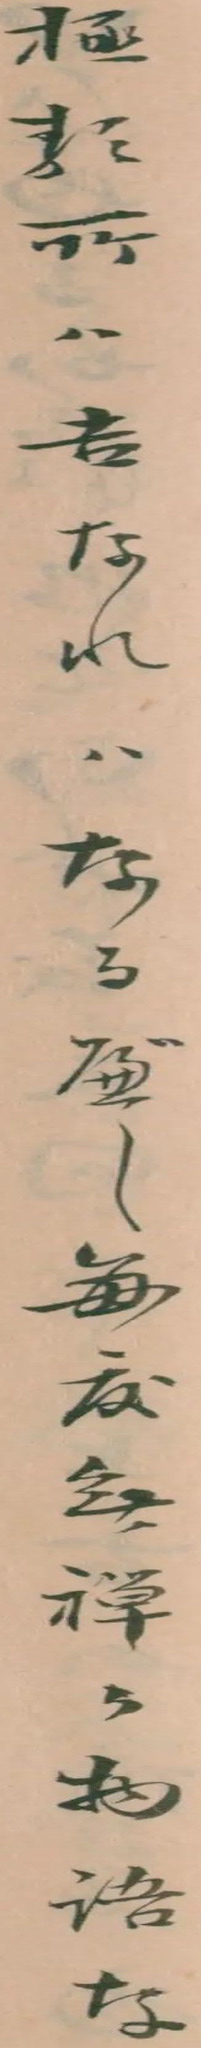極る所は吉なれはなるべし毎度無禅か物語な
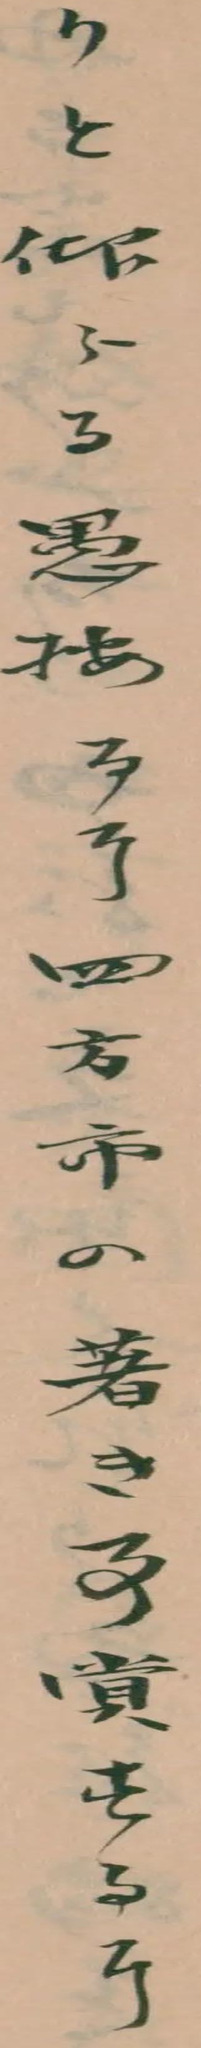りと仰らる愚按るに四方市の著き事賞するに
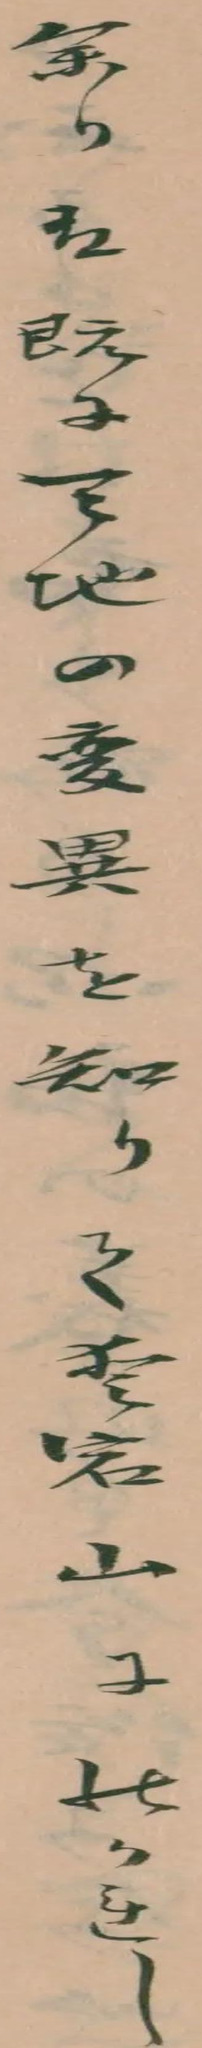余り有既に天地の変異を知りて愛宕山にのかれし
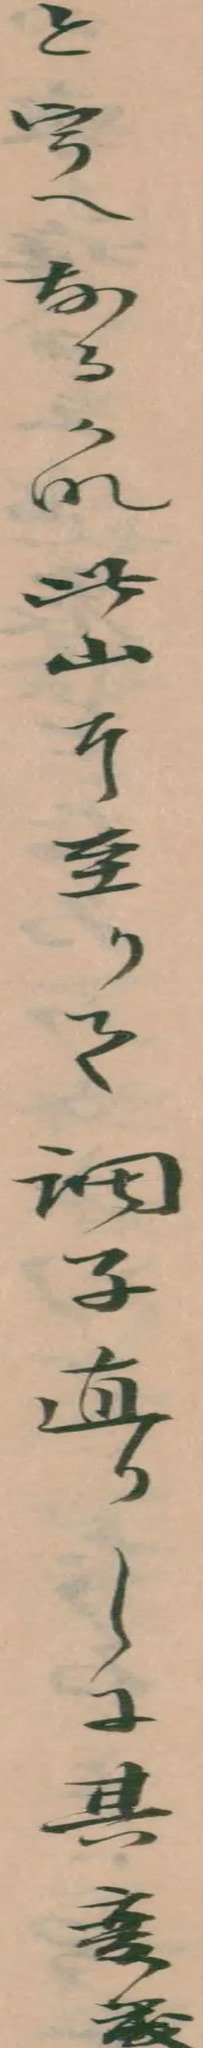とうへなるかな此山に至りて調子直りしに其変も
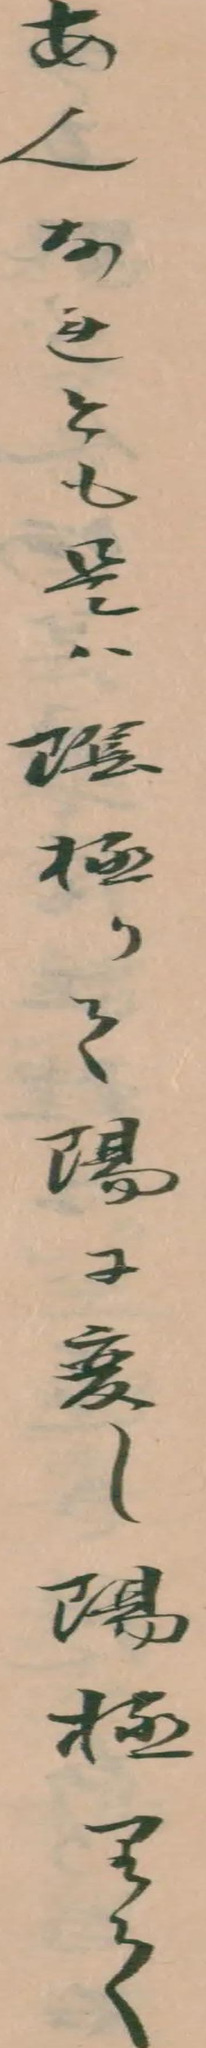あんなれとも是は陰極りて陽に変し陽極りて
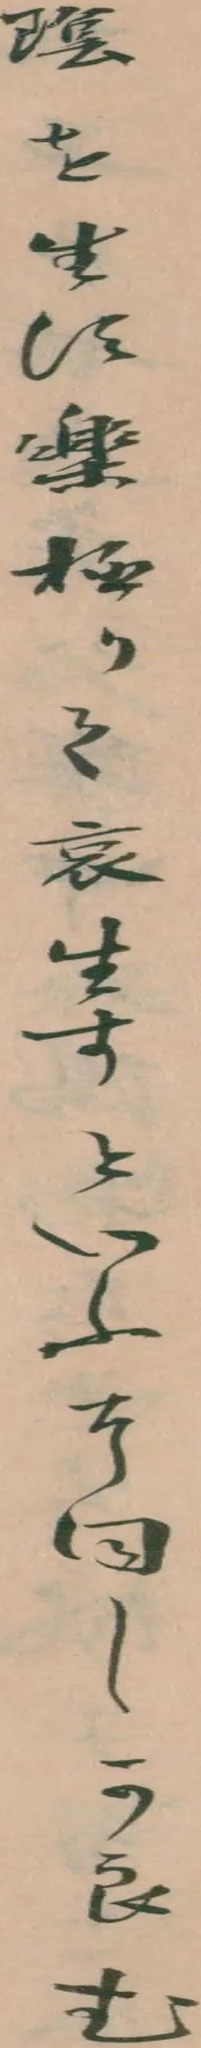陰を生す楽極りて哀生すといふに同しからむ
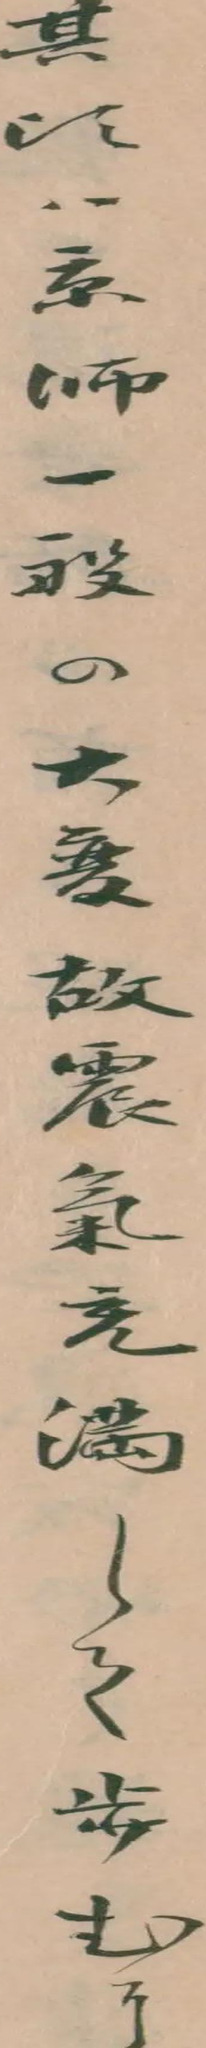其頃は京師一般の大変故震気充満して歩むに
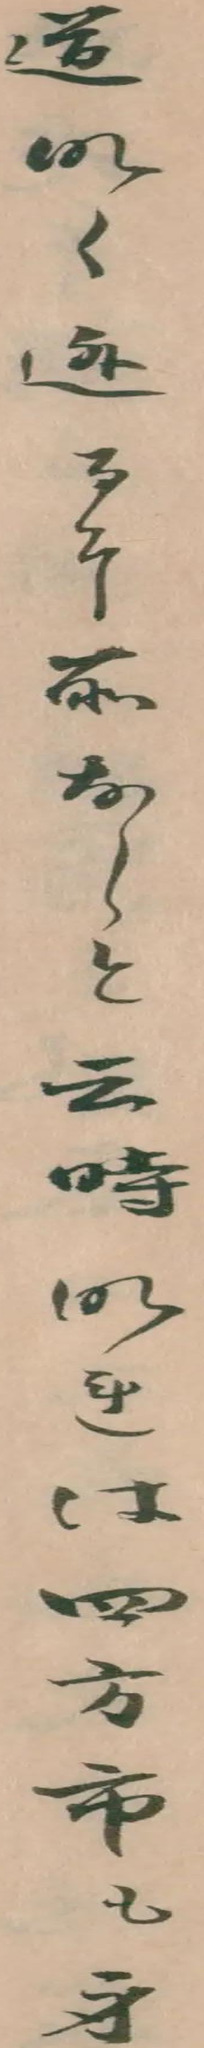道なく逃るに所なしと云時なれは四方市も身
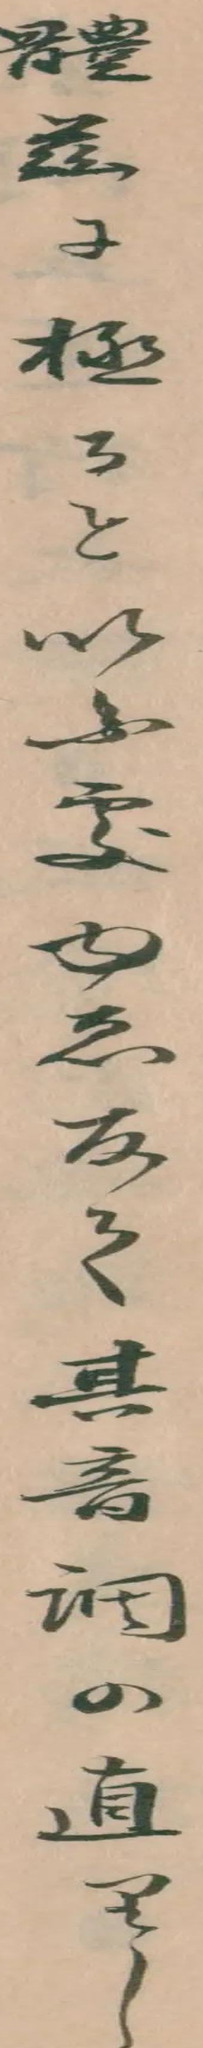体茲に極るといふ処ゆゑ反て其音調の直りし
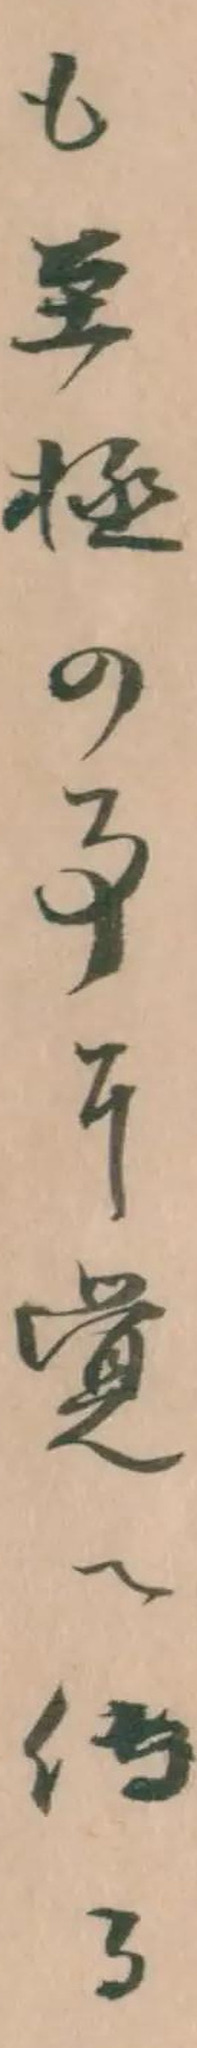も至極の事に覚へ侍る
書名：地災撮要. 巻5-6(地震之部)
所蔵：国立国会図書館 National Diet Library, JAPAN
